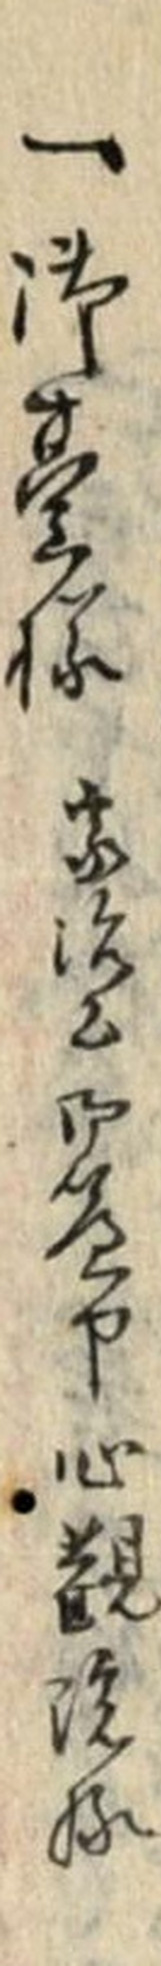一御台様家治公御簾中心観院様
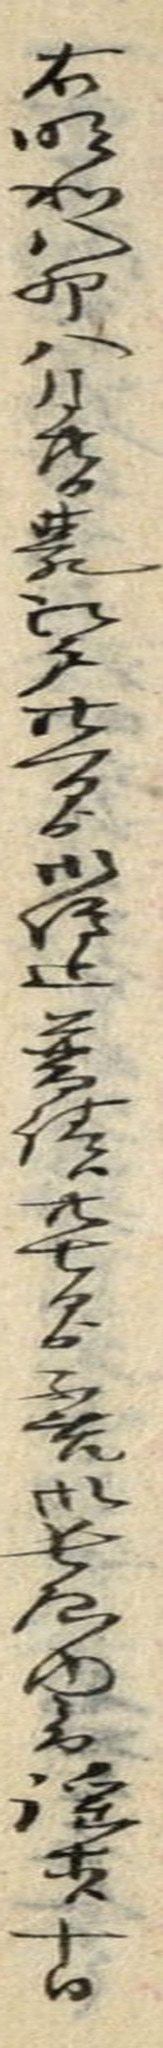右明和八卯八月廿日薨江戸廿一日ゟ御停止普請は廿七日ゟ不苦御長屋内にて謡等は十日
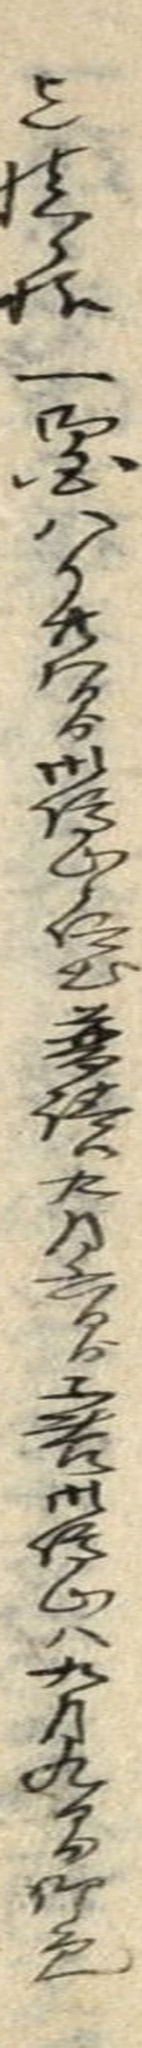迄慎候様一御国八月廿八日ゟ御停止被仰出普請は九月六日ゟ不苦御停止は九月九日ゟ御免
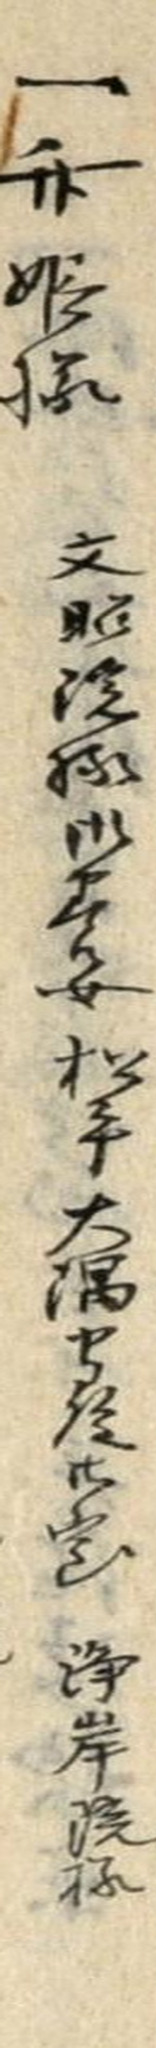一竹姫様文昭院様御養女松平大隅守殿御室浄岸院様
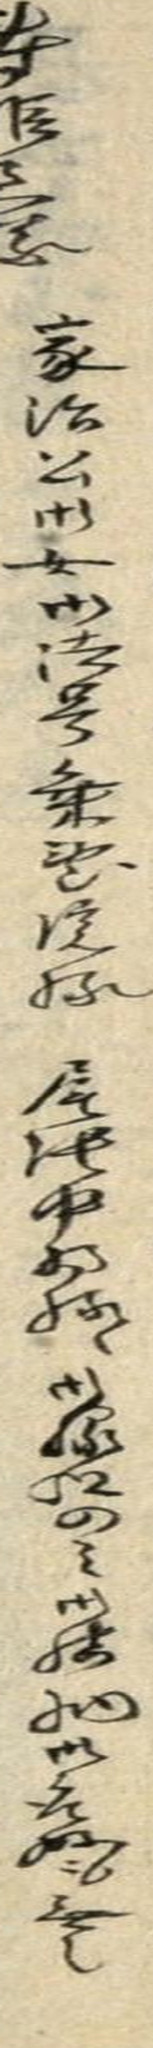一万寿姫君様家治公御女御法号乗台院様尾張中将様へ御縁組のみ御結納御取扱も無之
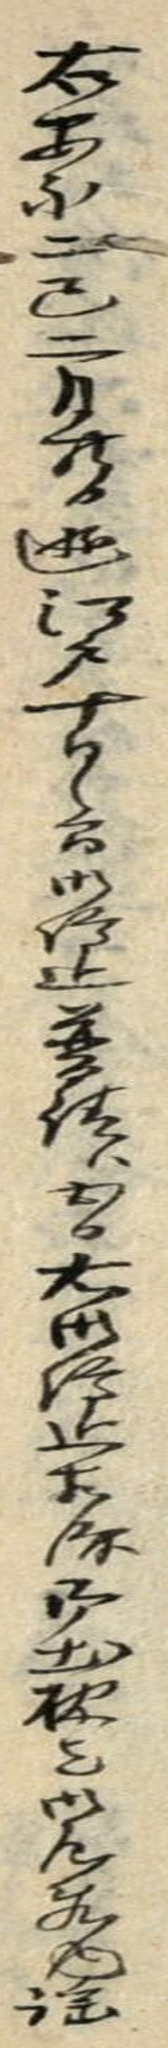右安永二巳二月廿日逝江戸十日之間御停止普請は五日右御停止相済御出棺迄御屋敷内謡

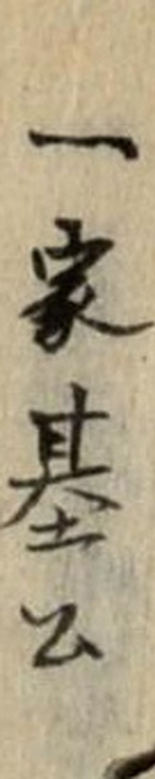一家基公
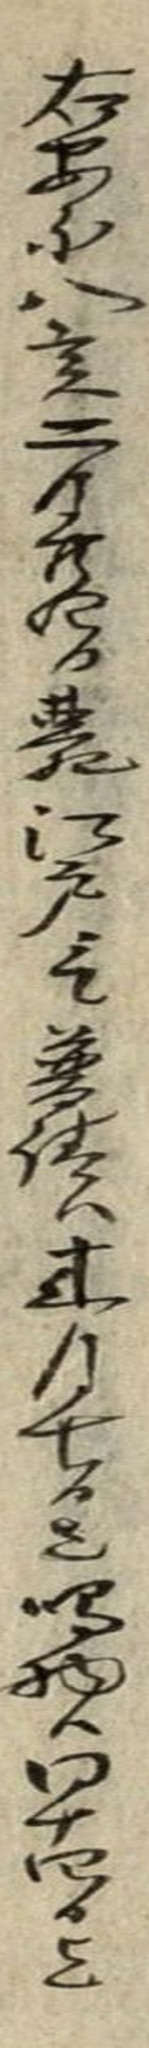右安永八亥二月廿四日薨江戸にて普請は来月七日迄鳴物は同十四日迄
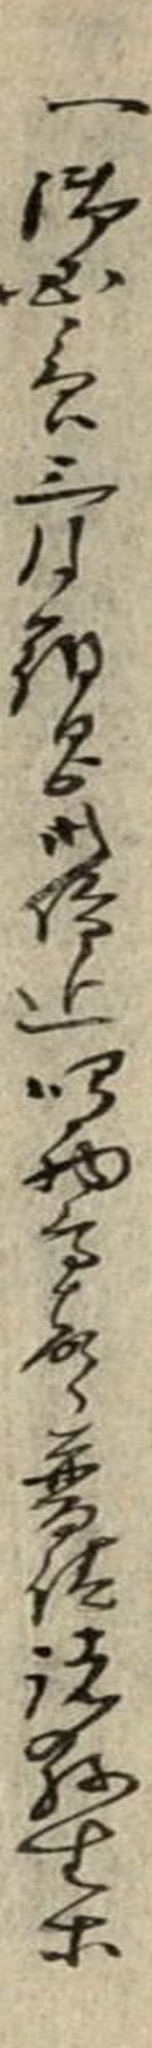一御国にては三月朔日ゟ御停止鳴物高声普請諸殺生等
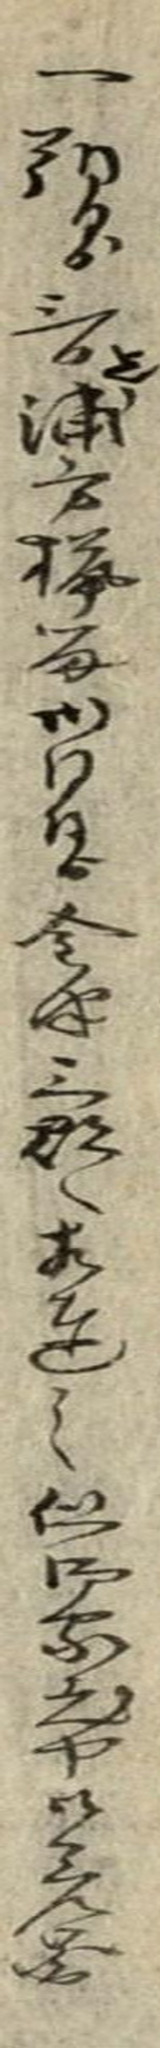一朔日ゟ三日迄浦方猟留御目付ゟ金津三郡へ相達之但御家老中御差図
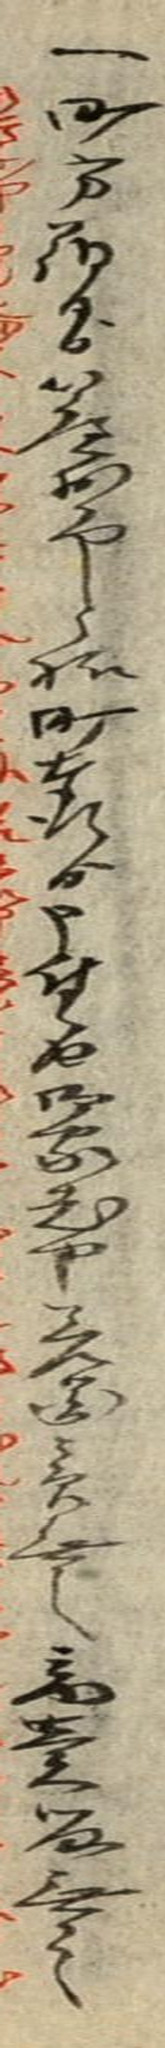一町方朔日ゟ簾おろし候様町奉行ゟ申付候由御家老中差図にては無之商売留無之
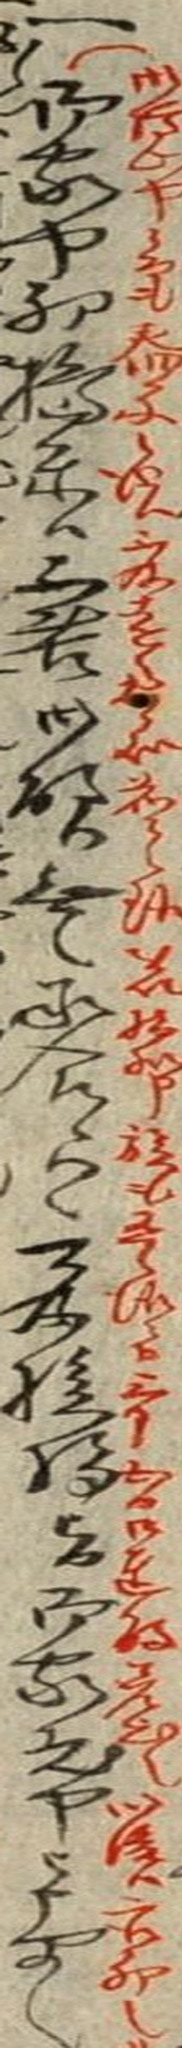一御家中初搗米は不苦御触は無之承合候はゝ可及挨拶旨御家老中被申聞候
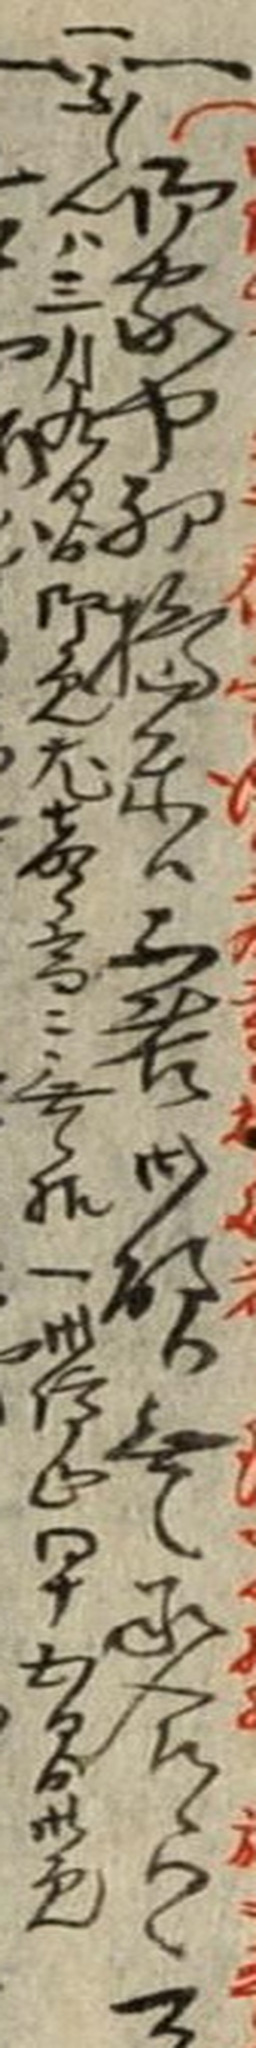一ふしんは三月九日ゟ御免尤声高に無之様一御停止同十五日ゟ御免
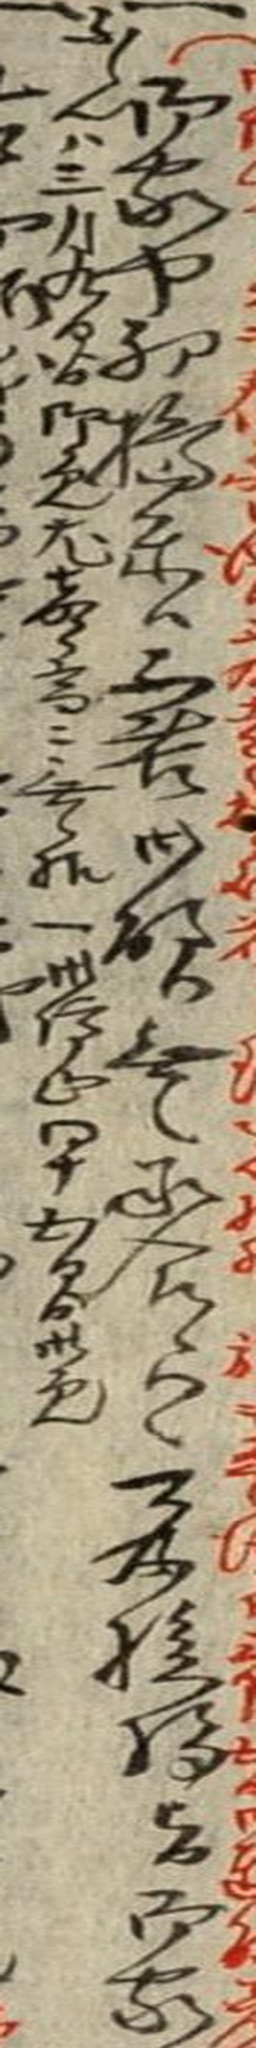一ふしんは三月九日ゟ御免尤声高に無之様一御停止同十五日ゟ御免
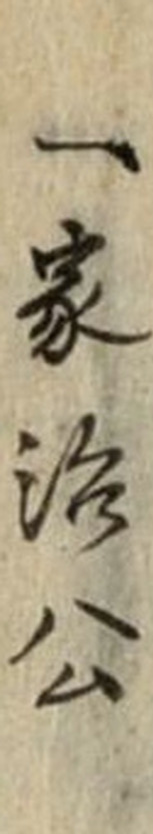一家治公
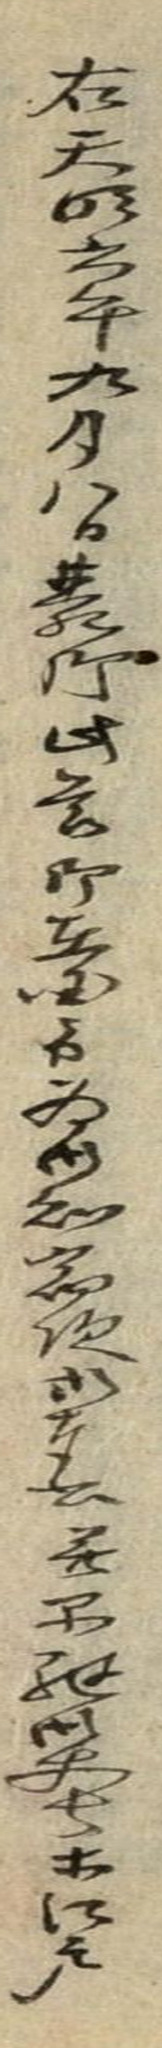右天明六午九月八日薨御此節御在国に付為御知宿次御奉書并早駆御使者等江戸
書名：御停止異変死失
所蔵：福井県文書館 Fukui Prefectural Archives
